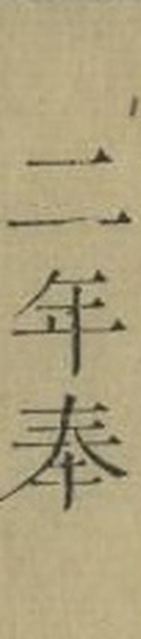二年奉
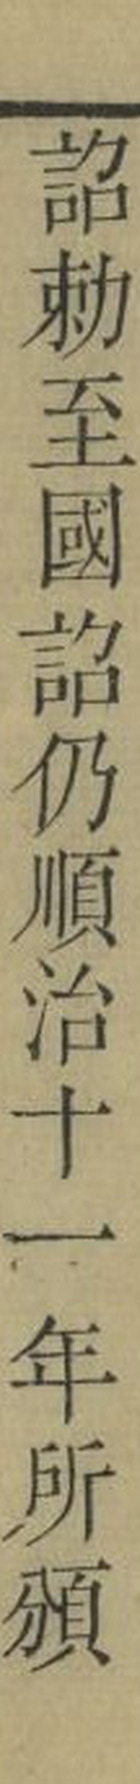詔勅至国詔仍順治十一年所頒
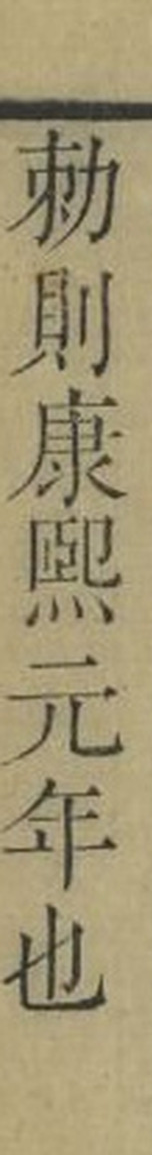勅則康煕元年也

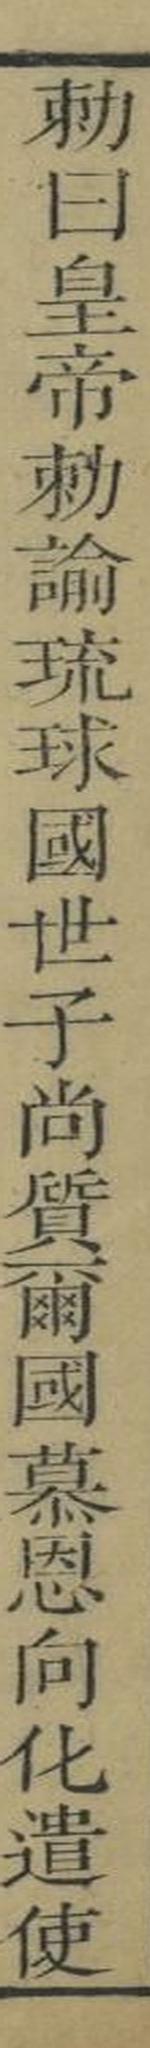勅曰皇帝勅諭琉球国世子尚質爾国慕恩向化遣使
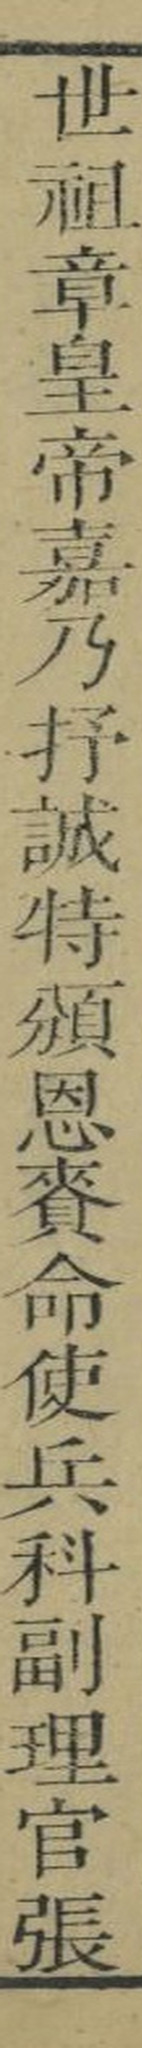世祖章皇帝嘉乃抒誠特頒恩賚命使兵科副理官張
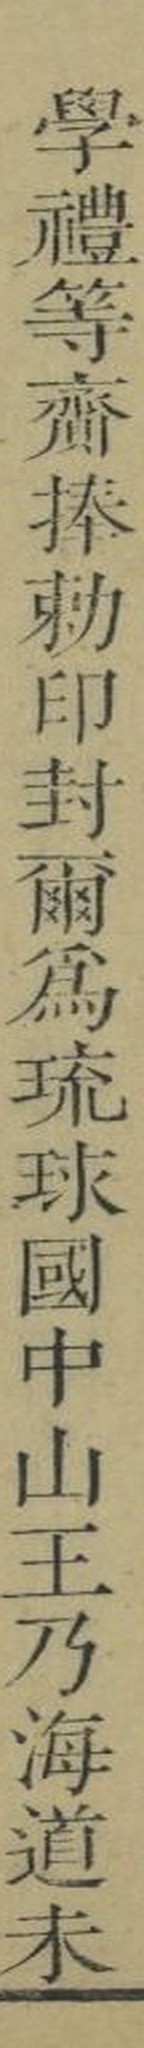学礼等齎捧勅印封爾為琉球国中山王乃海道未
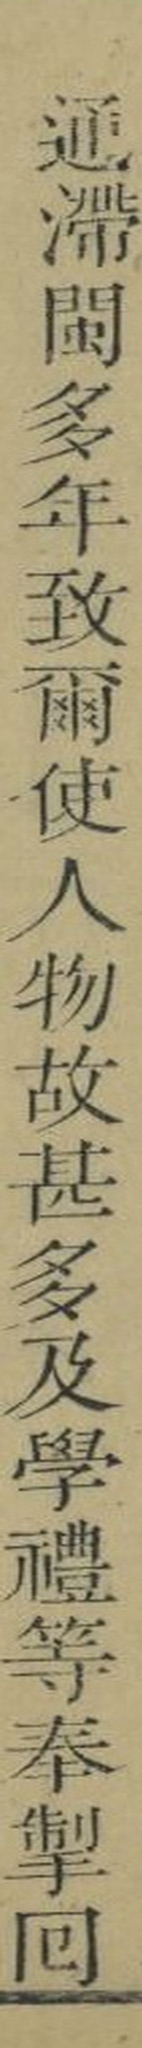通滞閩多年致爾使人物故甚多及学礼等奉掣回
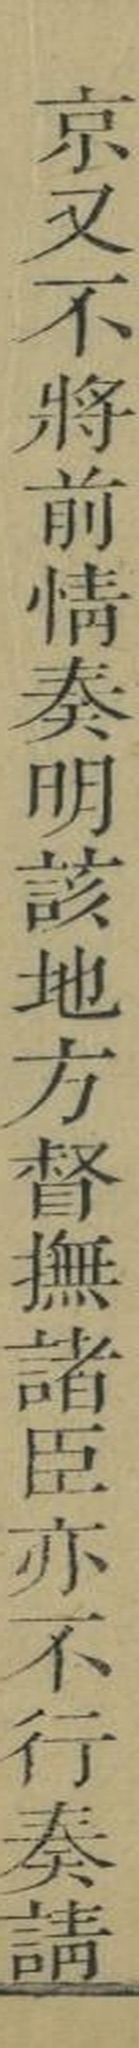京又不将前情奏明該地方督撫諸臣亦不行奏請
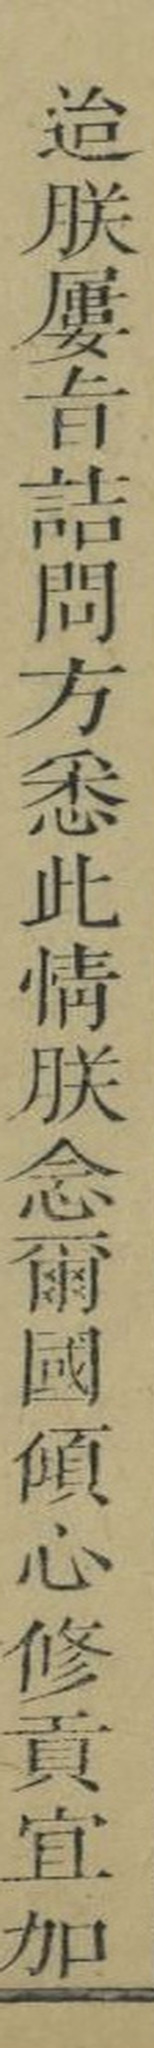迨朕屢旨詰問方悉此情朕念爾国傾心修貢宜加
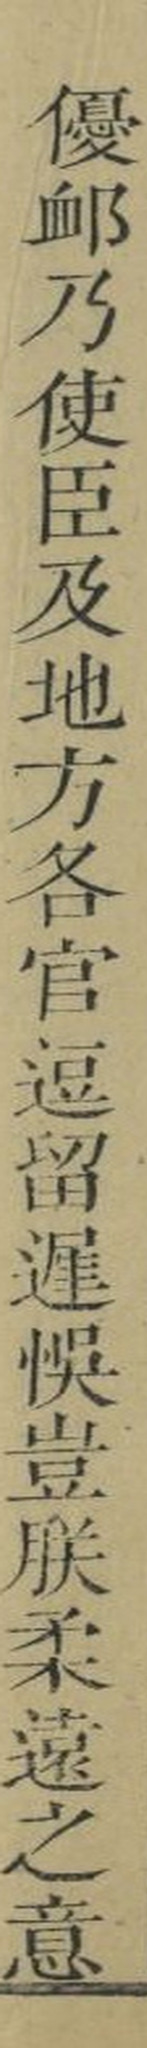優恤乃使臣及地方各官逗留遅悞豈朕柔遠之意
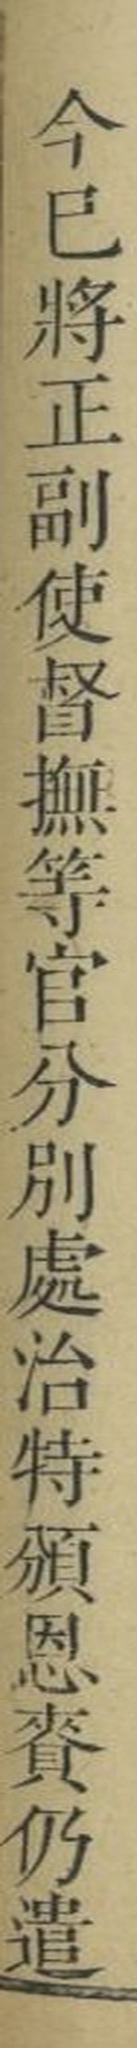今巳将正副使督撫等官分別処治特頒恩賚仍遣
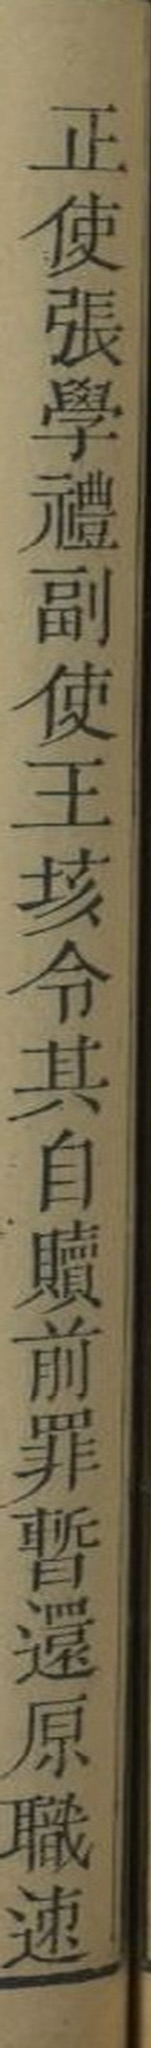正使張学礼副使王垓令其自贖前罪暫還原職速
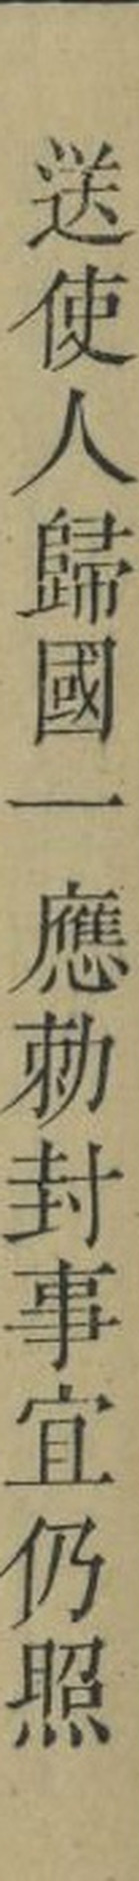送使人帰国一応勅封事宜仍照
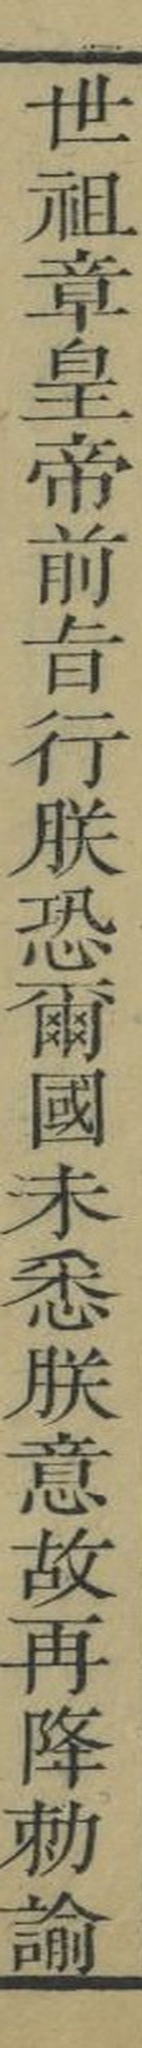世祖章皇帝前旨行朕恐爾国未悉朕意故再降勅諭
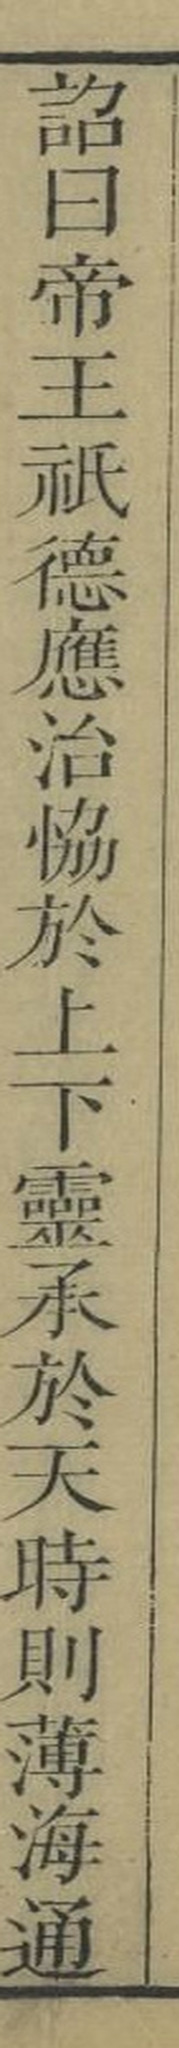詔曰帝王祇徳応治恊於上下霊承於天時則薄海通
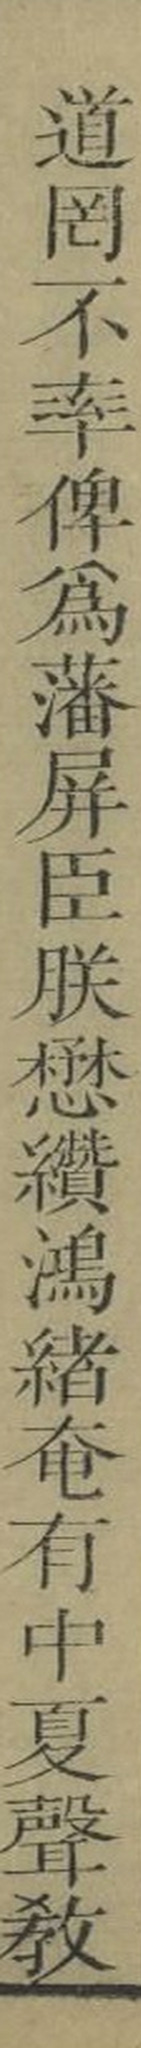道罔不率俾為藩屏臣朕懋纘鴻緒奄有中夏声教
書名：中山伝信録 巻三
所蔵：University of the Ryukyus Library
